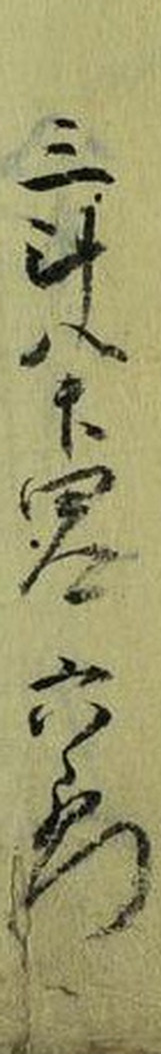廿一歩八升四合六郎右衛門
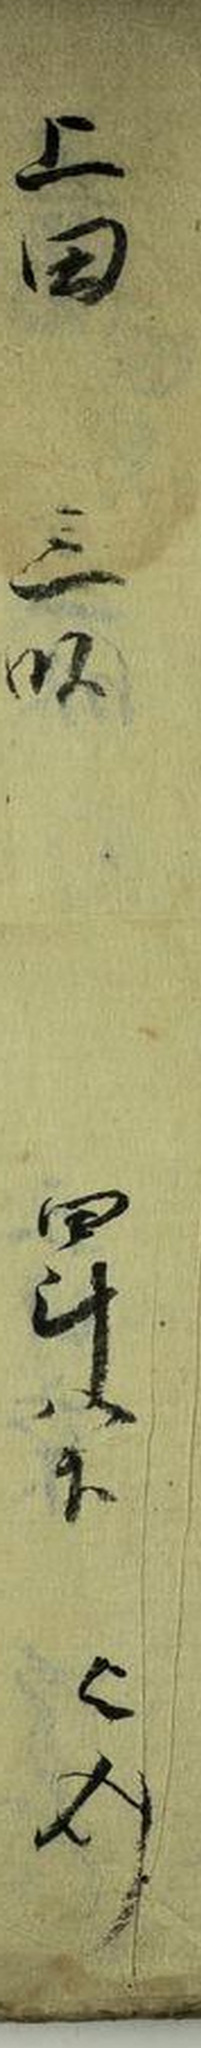上田三畝四斗八升予介

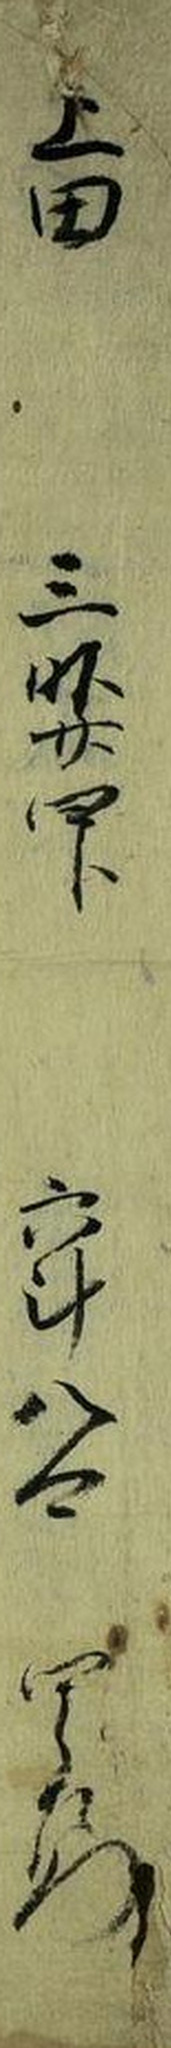上田三畝廿四歩六斗八合四郎左衛門
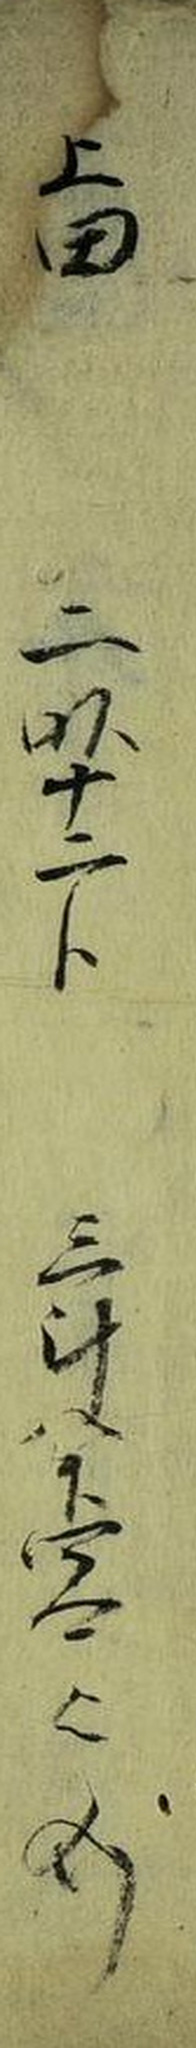上田二畝十二歩三斗八升四合とみ
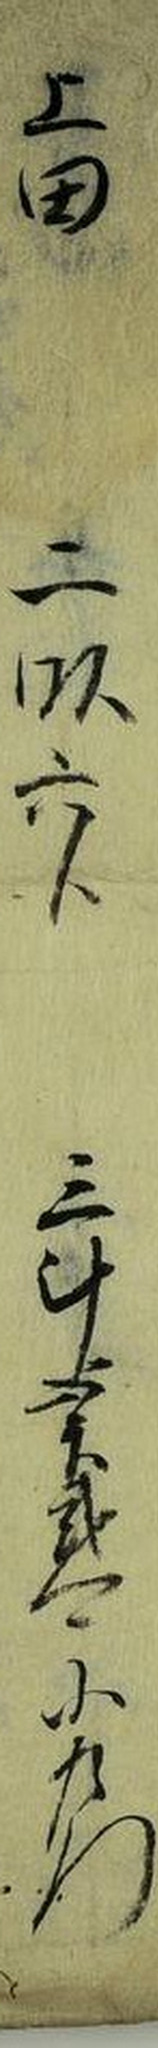上田二畝六歩三斗五升二合小左衛門
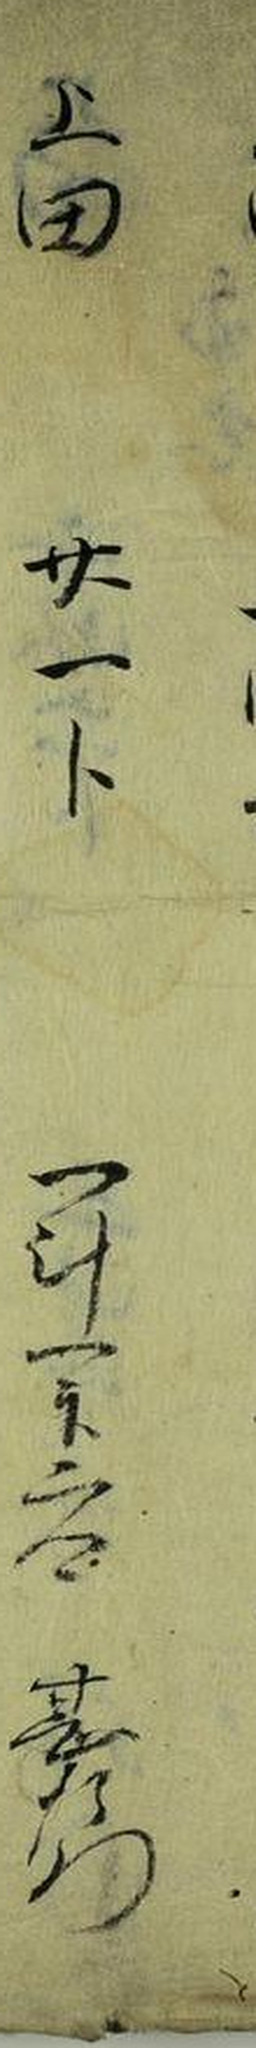上田廿一歩一斗一升二合甚左衛門
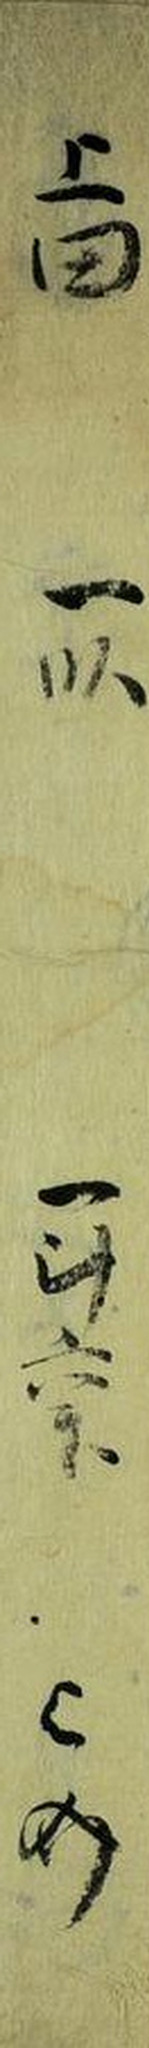上田一畝一斗六升とみ

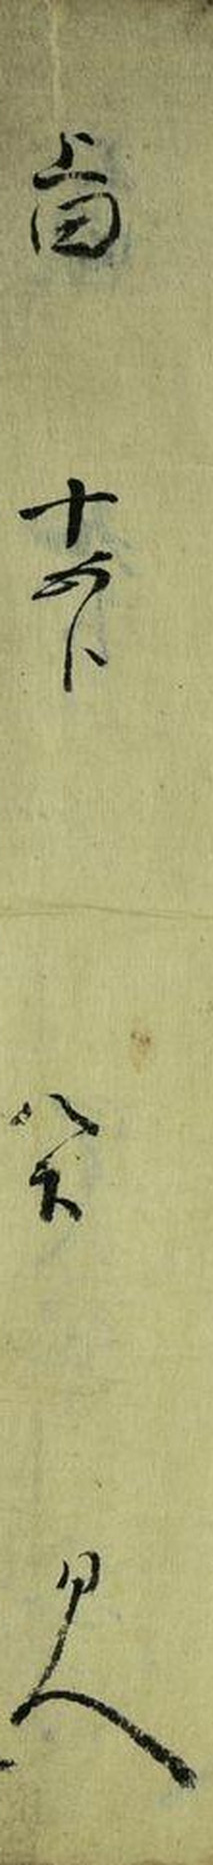上田十五歩八升同人

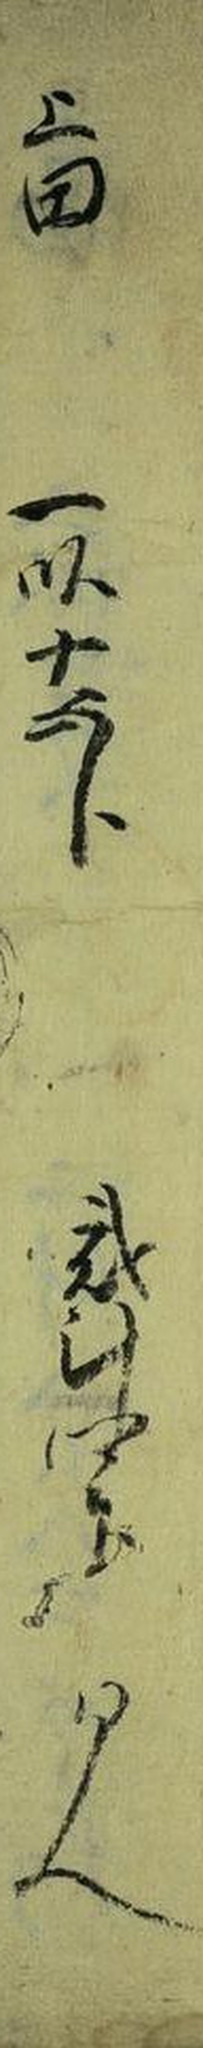上田一畝十五歩弐斗四升同人
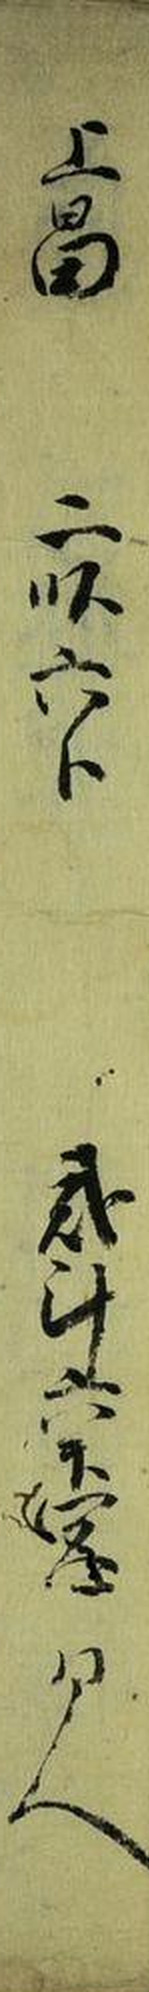上畠二畝六歩弐斗六升四合同人
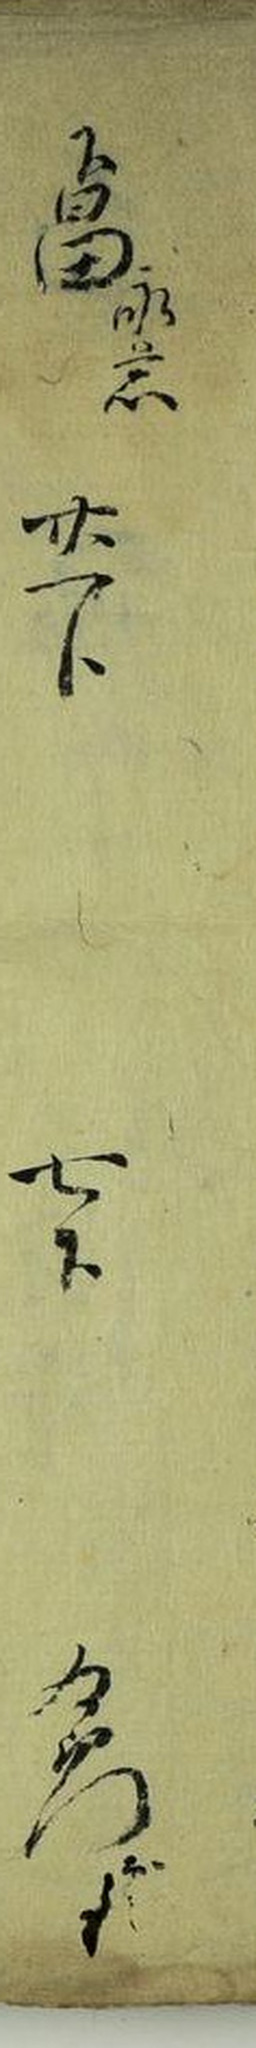下畠廿一歩七升為右衛門
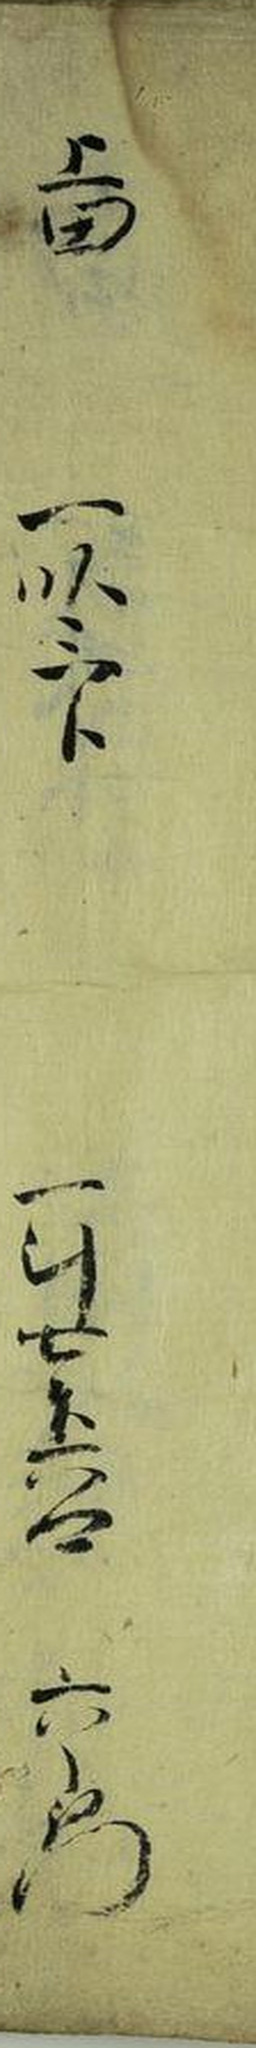上田一畝三歩一斗七升六合六郎右衛門
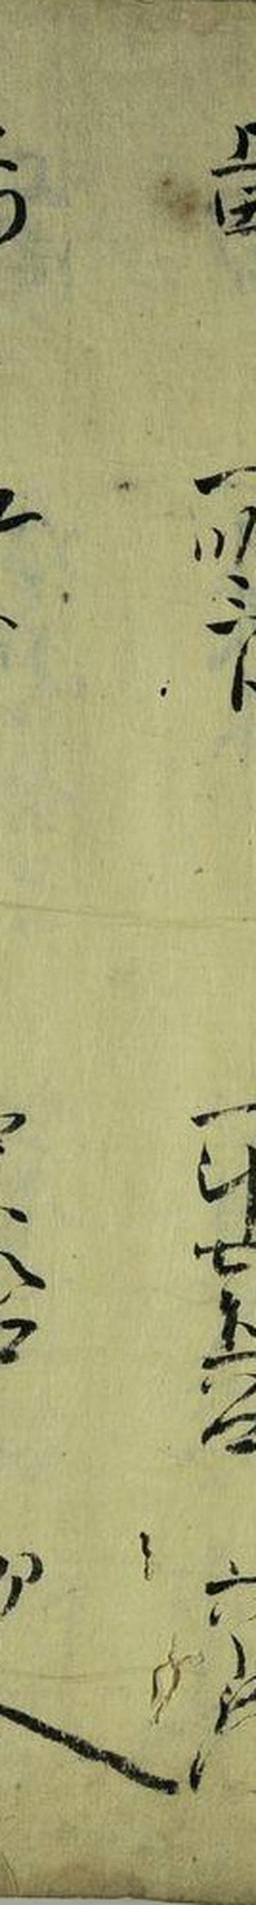上田九歩四升八合同人
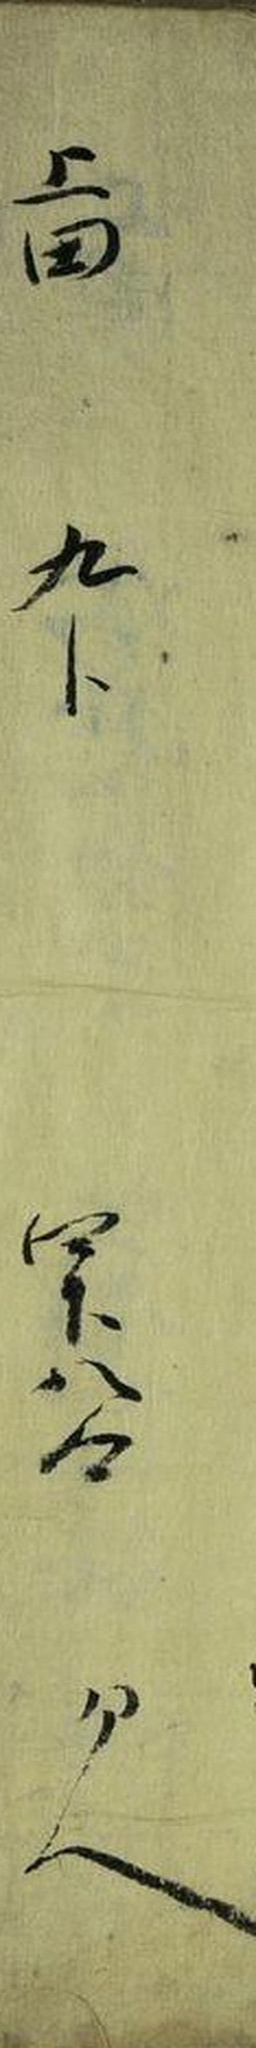上田九歩四升八合同人
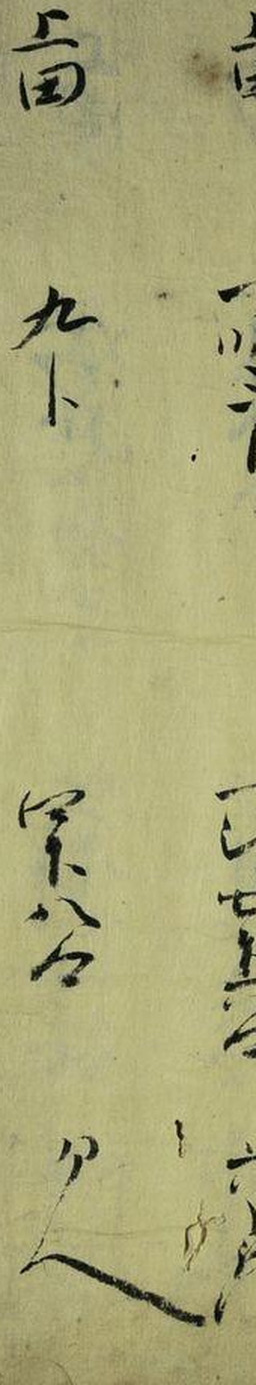上田九歩四升八合同人
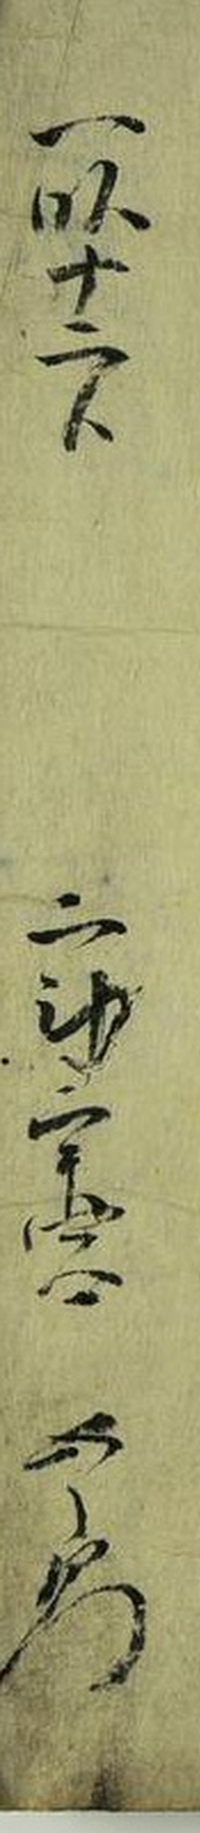上田一畝十二歩二斗二升四合五郎右衛門
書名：越前国中墨郡安沢村水帳（太閤検地帳）
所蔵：福井県文書館 Fukui Prefectural Archives
